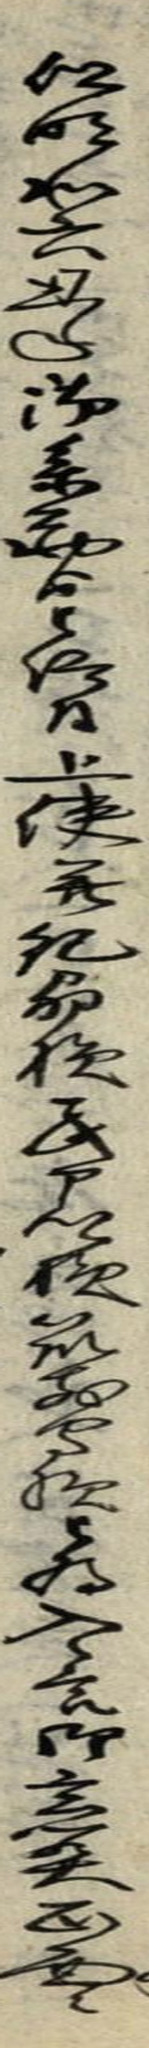但明和六丑年御参勤ゟ被仰付上使并紀州様民部卿様筑前守様被為入候節御玄関正面に
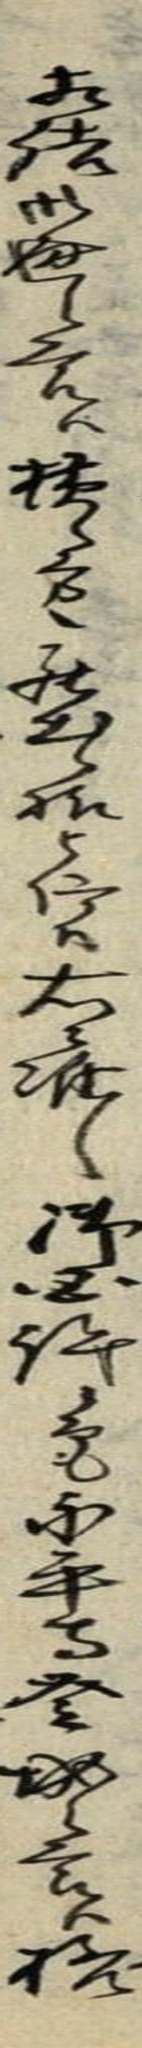相詰御通之節は横之方へ罷出候様被仰付右に准し御国許に而も永平寺登城之節は格
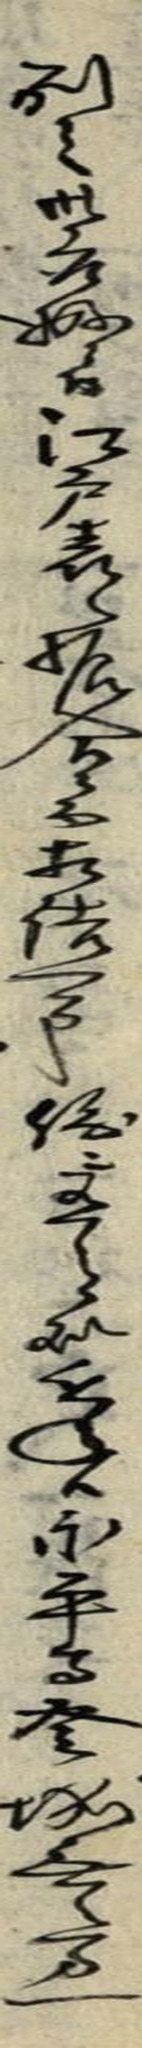別之御取扱に付江戸表へ振合に而相詰可申儀に有之候処近年は永平寺登城無之万一
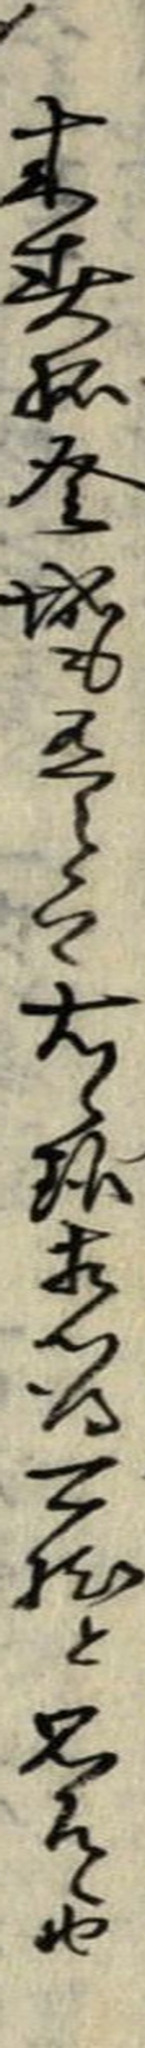来春抔登城も有之候はゝ右之趣相心得可然と思召候由
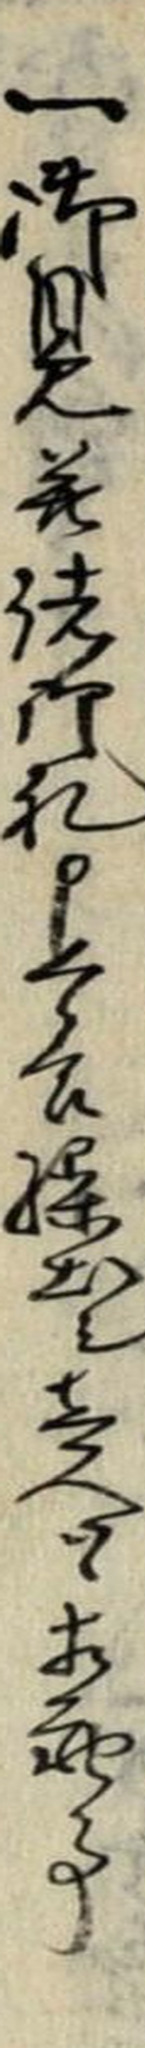一御目見并諸御礼申上候節繰出し壱人つゝ相勤候事
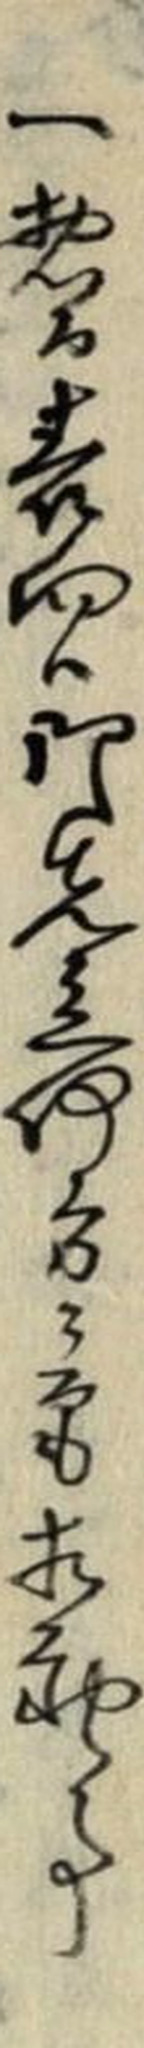一惣而表向は御先立何方に而も相勤候事
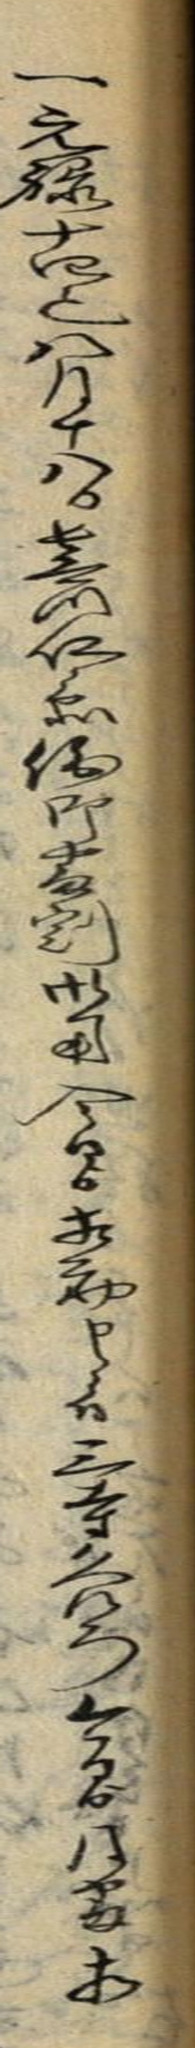一元禄十四巳八月十八日長谷川仁兵衛儀御番割御用今日ゟ相勤申候付三寺久左衛門今日ゟ月番相
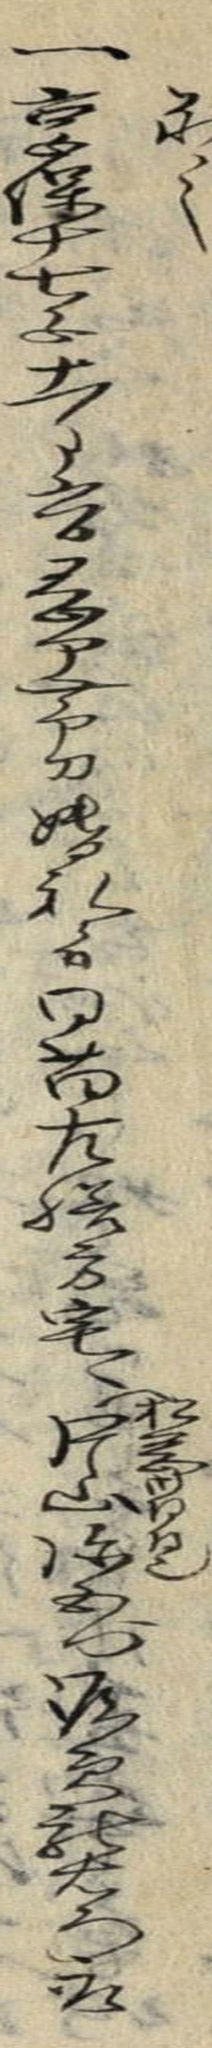一享保十七子十一月六日岡部帯刀婚礼に付同苗左膳方宅へ松岡御目付也片山弥五右衛門渥美新右衛門取
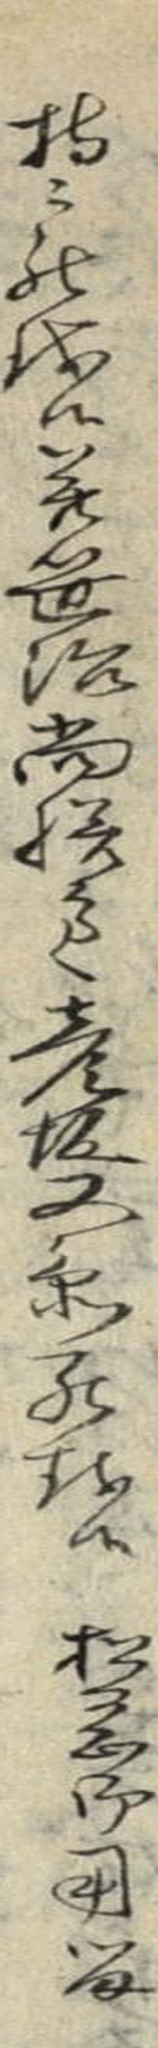持に罷越候并笹治尚膳方へ彦坂又兵衛罷越候松岡御用留
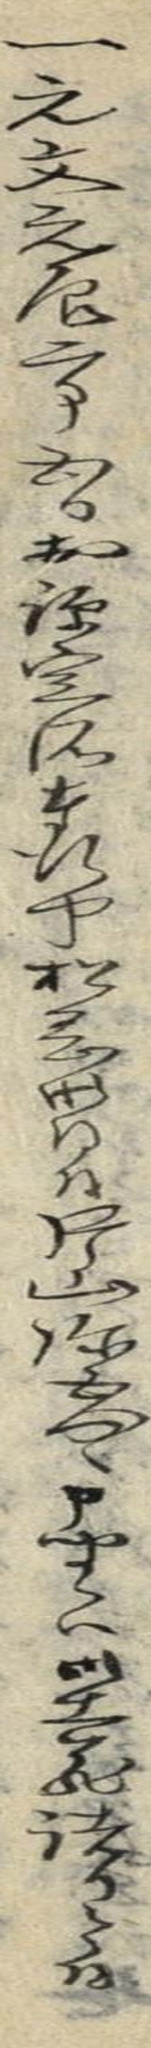一元文元辰二月五日於評定所奉行中松岡御目付片山弥五右衛門へ申聞候は御土蔵詰り候に付
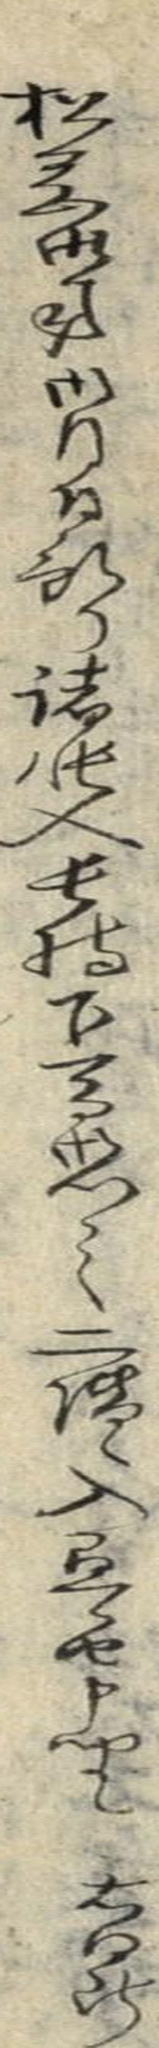松岡御用御目付預り諸帳入長持下馬御門之二階へ入置候由申聞候右同断
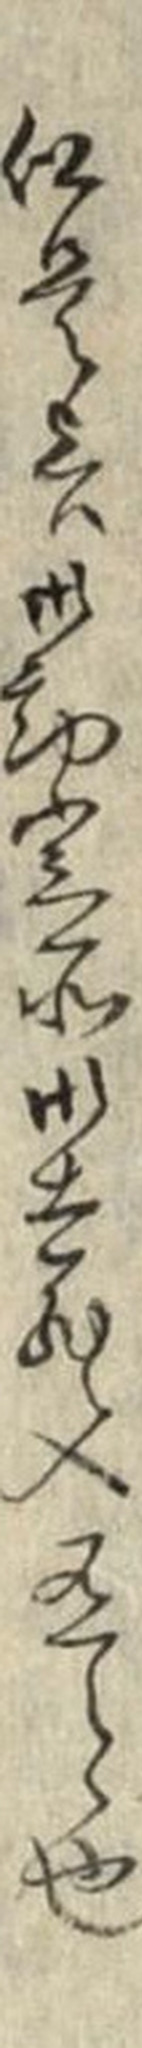但是迄は御勘定所御土蔵へ入有之候也
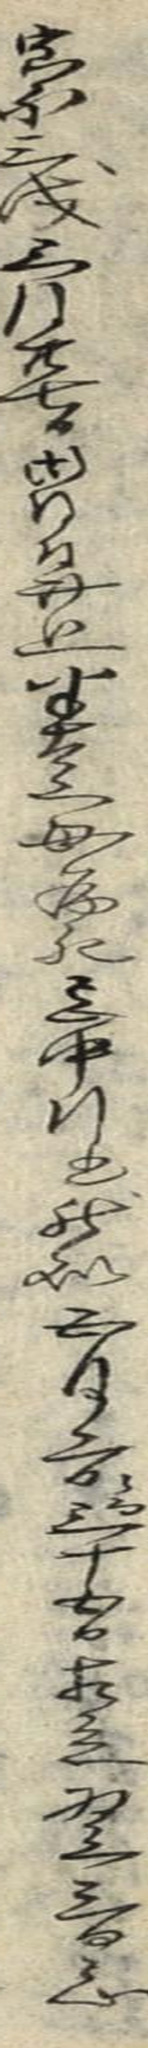一宝永三戌三月廿七日御目付井上半太夫母病死忌中引込然候処五月二日に而三十五日相立翌三日忌
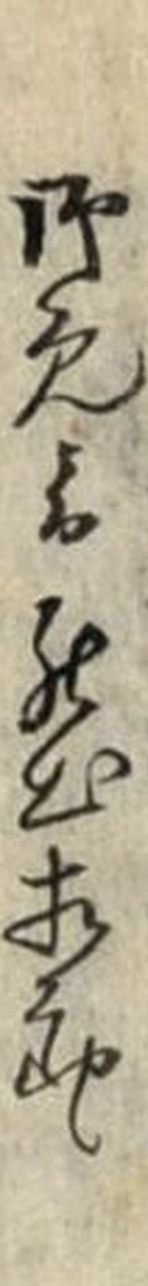御免に而罷出相勤候
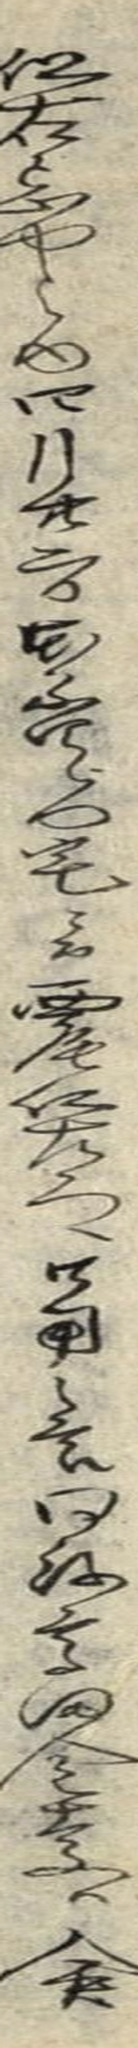但右忌中之内四月廿二日本多四郎右衛門宅に而西尾仁左衛門へ御用之節同役高田金太夫は僉
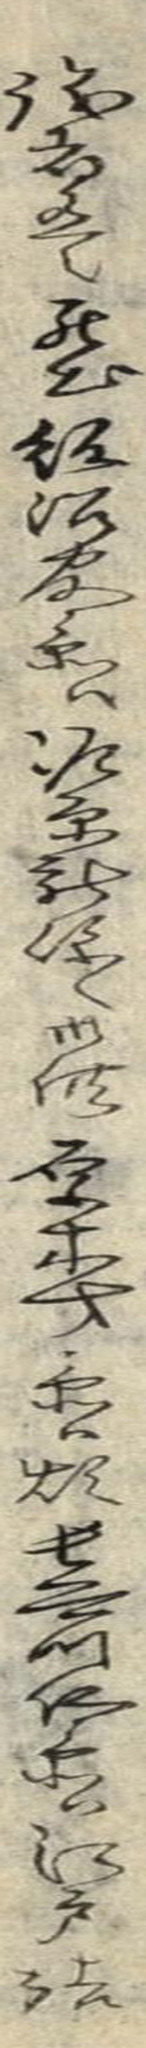議者有之罷出飯沼官兵衛は泥原新保へ御供厚木才兵衛は煩長谷川仁兵衛は江戸詰
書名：蒐輯之部
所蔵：福井県文書館 Fukui Prefectural Archives
